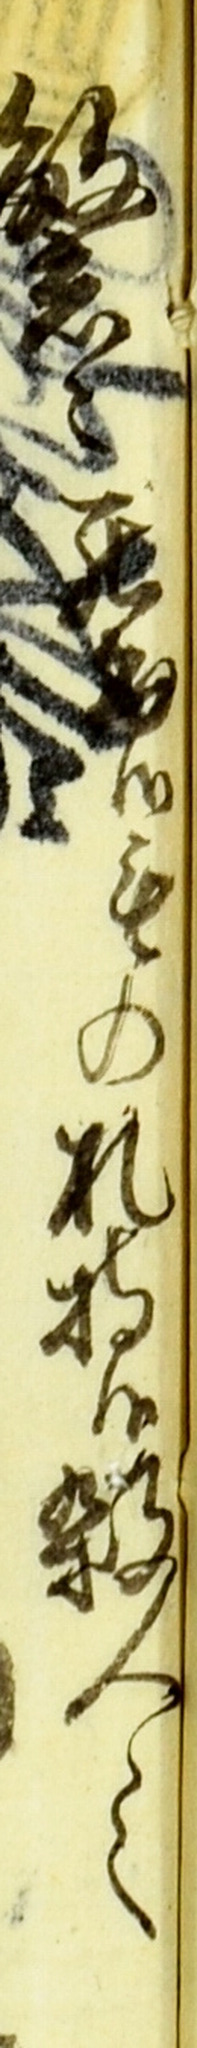繁々罷出候もの札持候殺人之
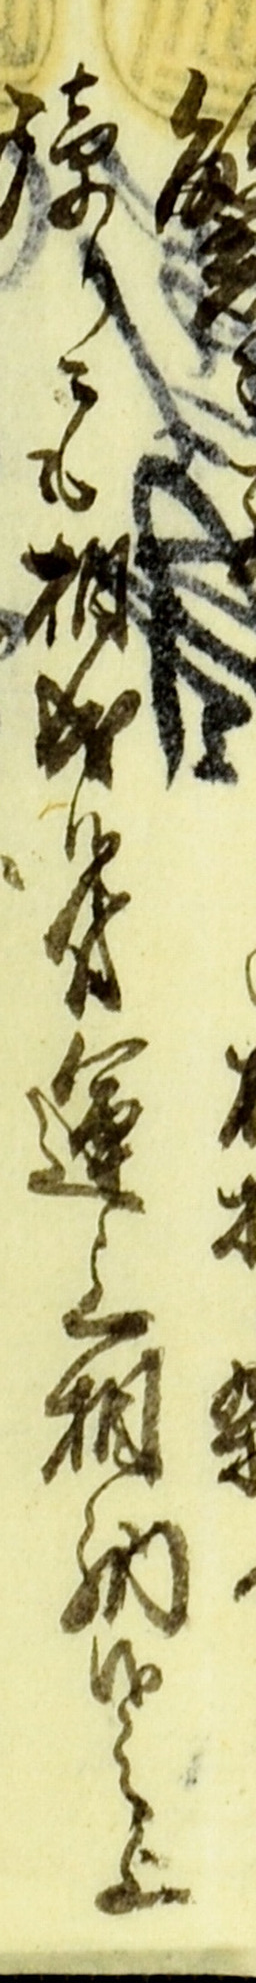障りニも相成候付運上相納候之上
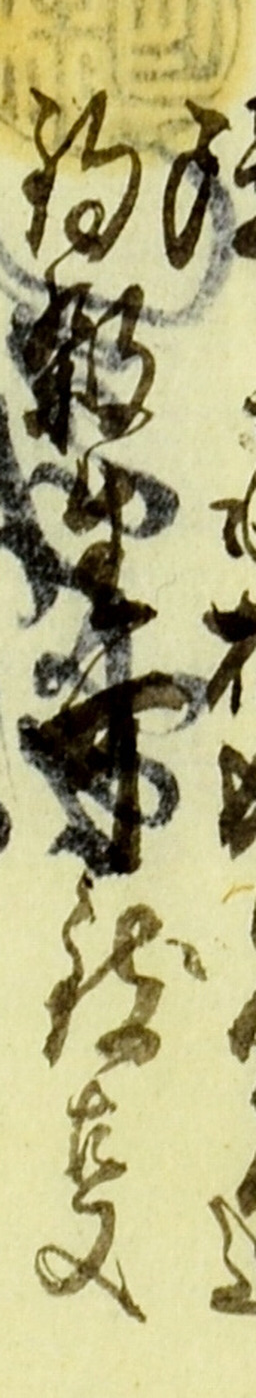釣殺生可致事
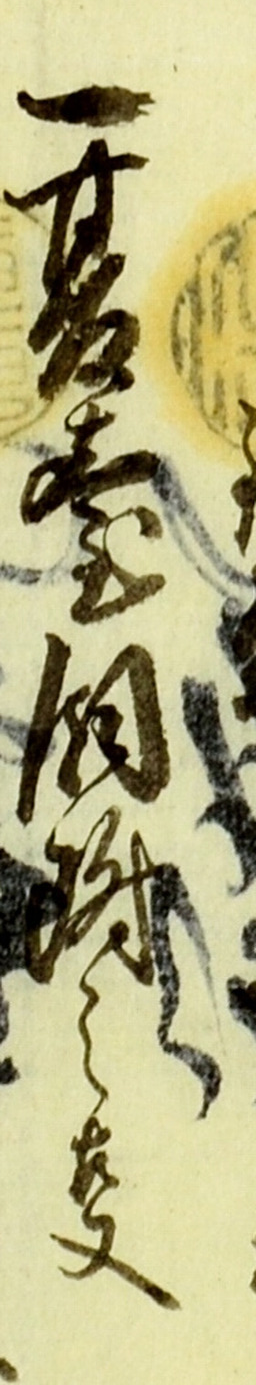一夏壺飼附之事
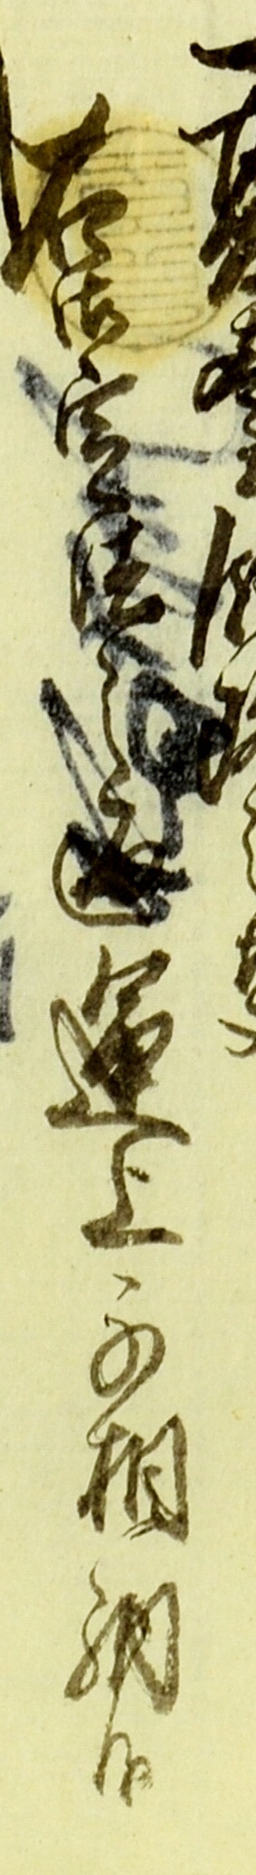右御定法之通運上可能相納候
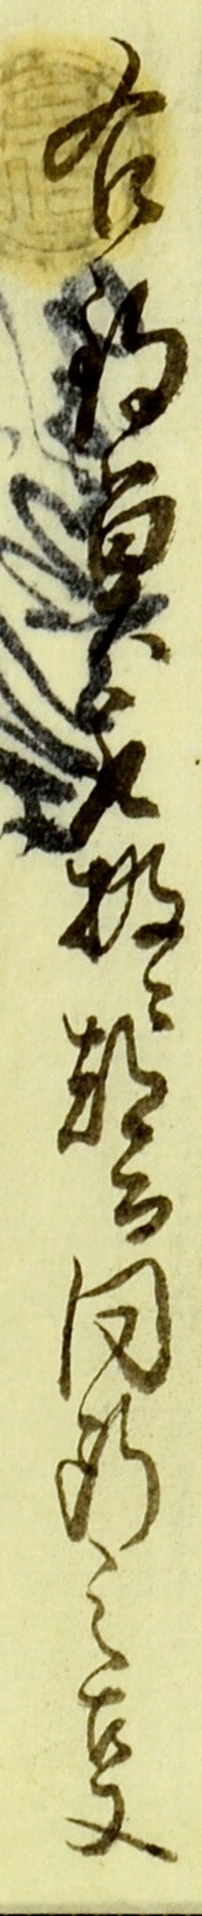右釣魚取扱ニ都而同断之事
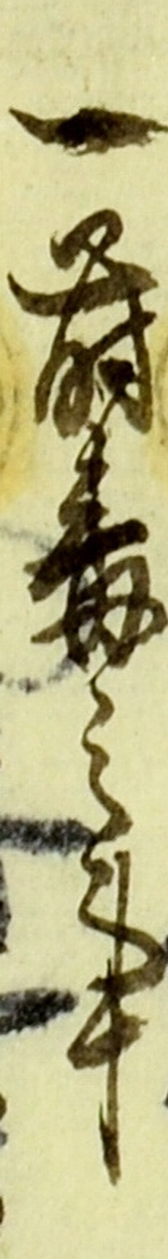一蒔毒之事
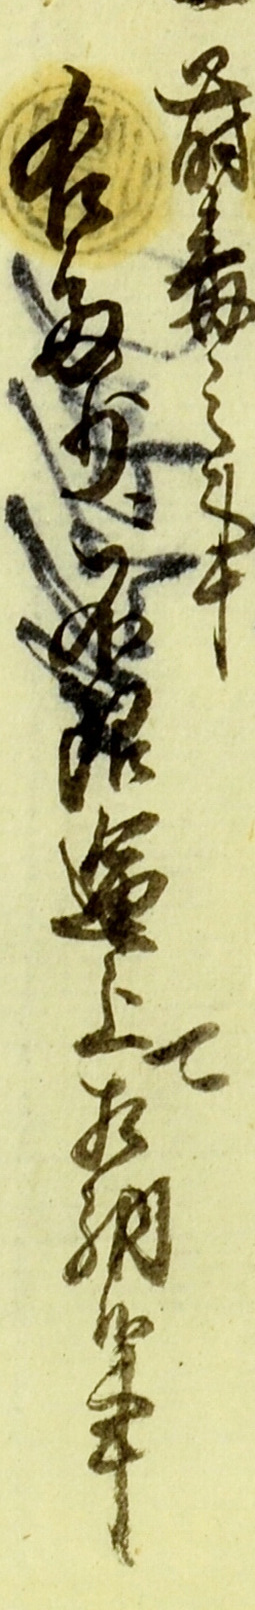右多少ニ不限運上相納候事
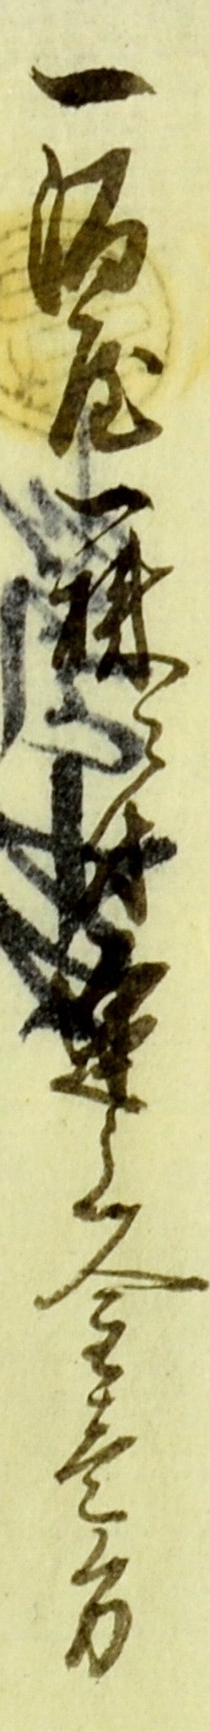一酒屋一株ニ付運上金壱分
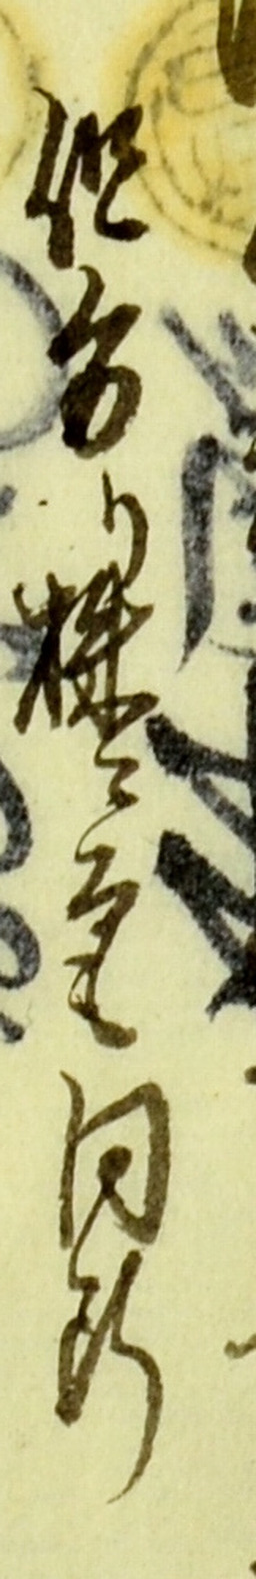但分り株ニ而も同断
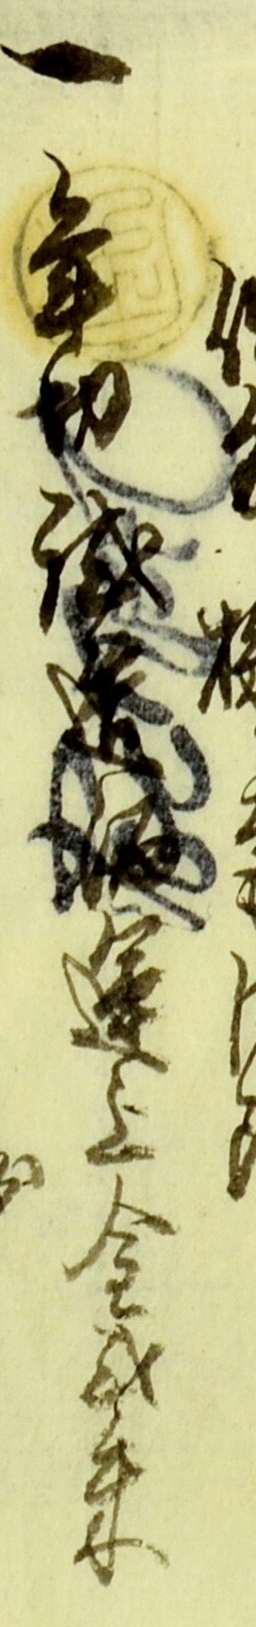一年切試造酒運上金弐朱
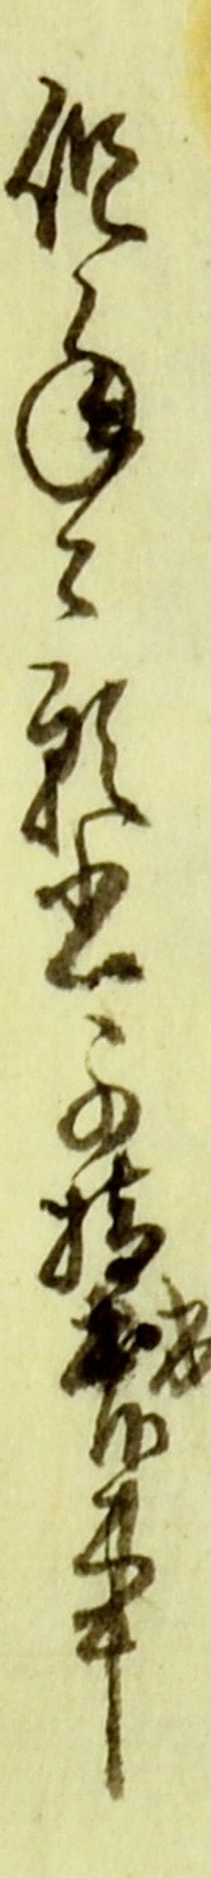但年々願出可指出候事

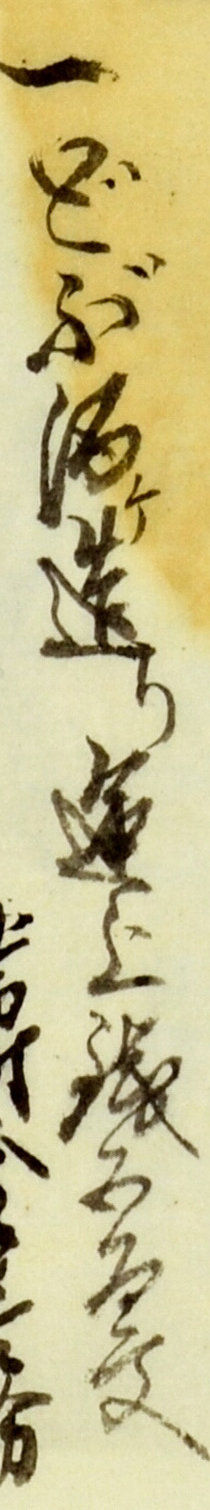一どぶ酒ケ造り運上銭五百文
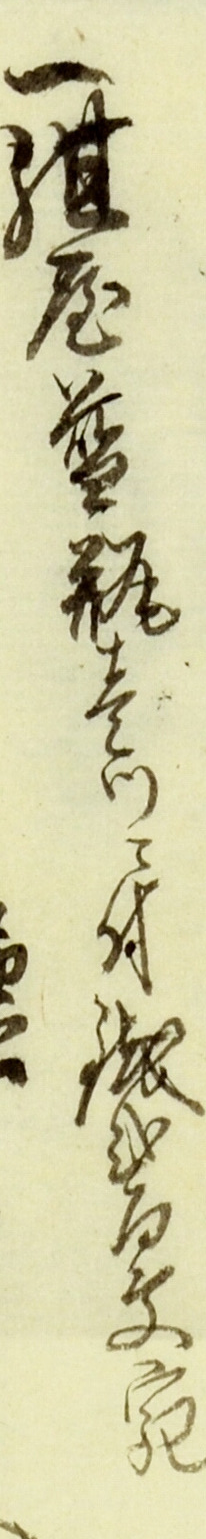一紺屋藍瓶壱ツニ付銭弐百文宛
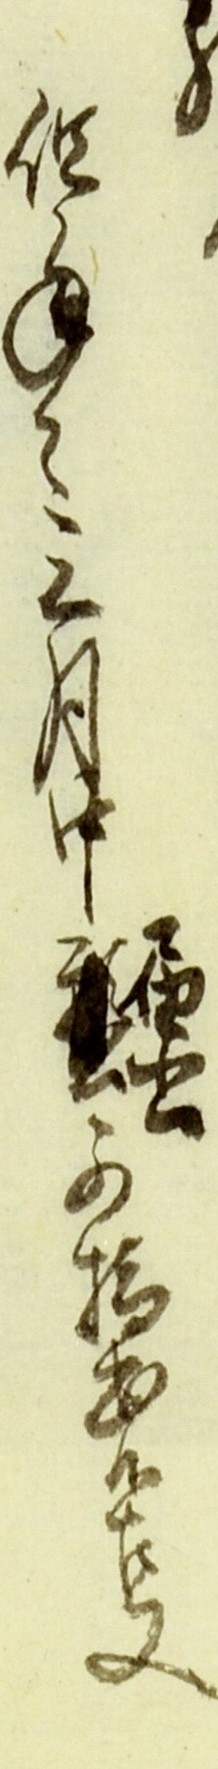但年々三月中届出可能指出候事
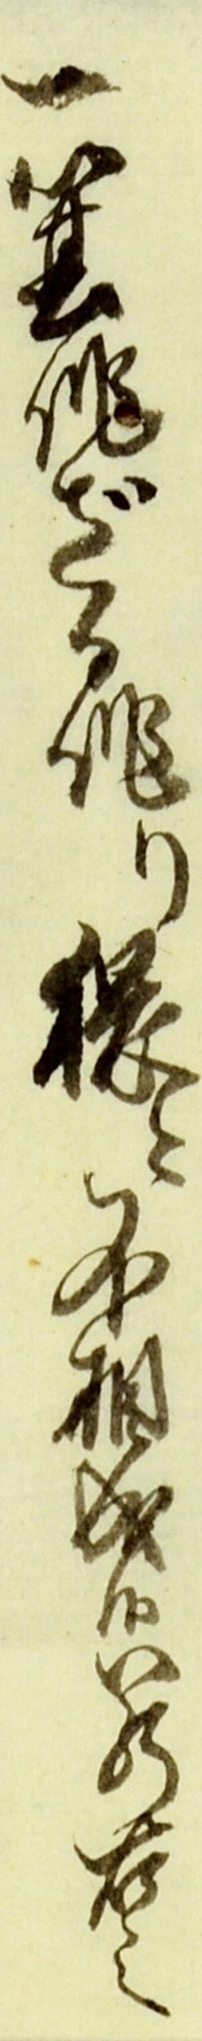一箕作ざる作り猥ニ不相成候若右之
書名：分一方諸運上御定法
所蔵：伊那市立高遠町図書館・合同会社AMANE
